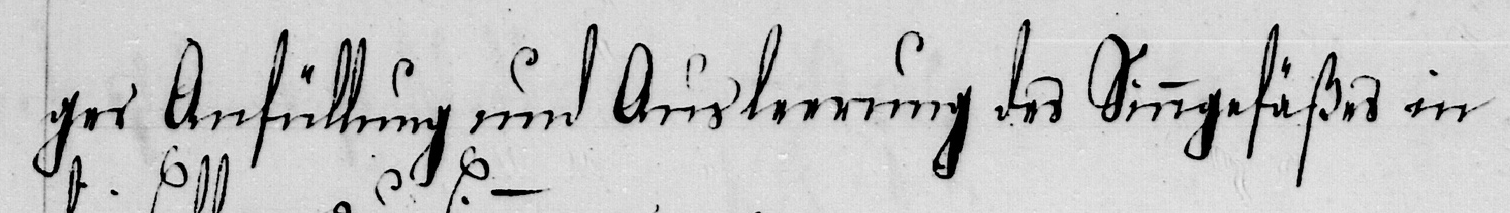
ger Anfüllung und Ausleerung des Sinngefäßes in
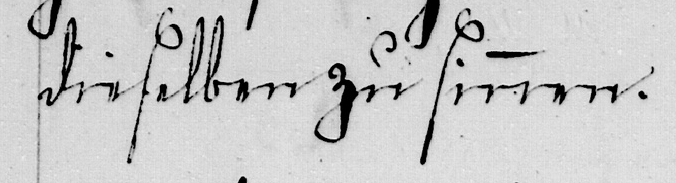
dieselben zu sinnen.
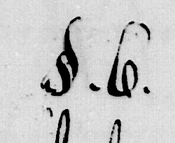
§. 6.
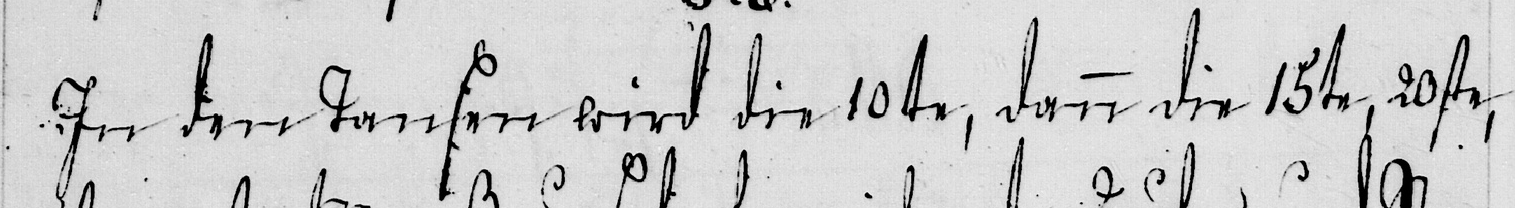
In den Tansen wird die 10te, dann die 15te, 20ste,
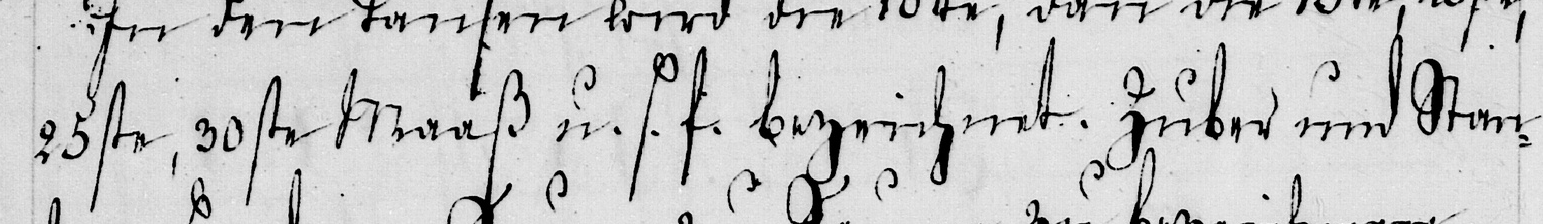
25ste, 30ste Maaß u. s. f. bezeichnet. Zuber und Stan¬
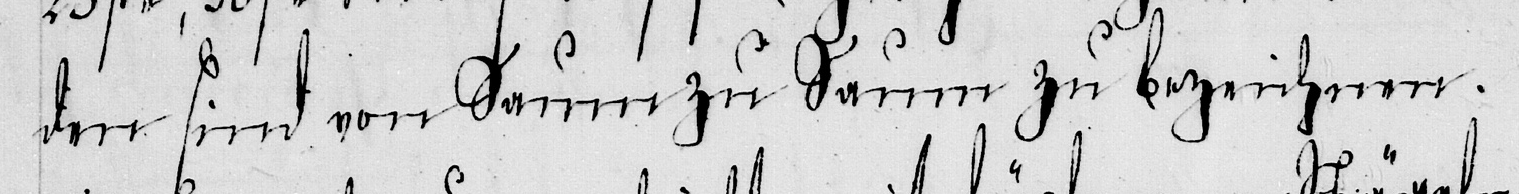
den sind von Saum zu Saum zu bezeichnen.
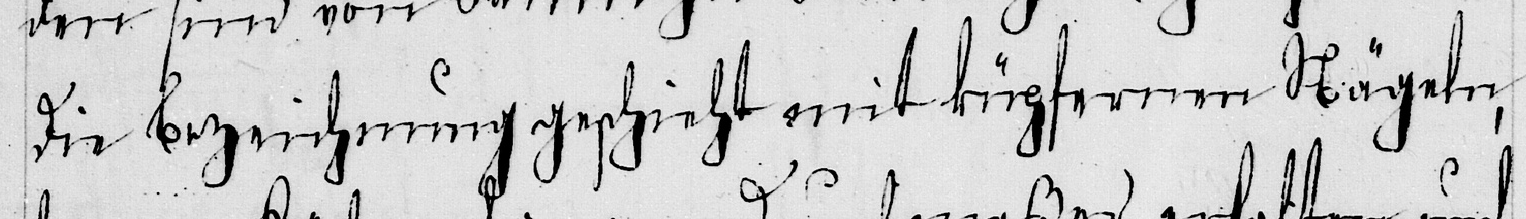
Die Bezeichnung geschieht mit kupfernen Nägeln,
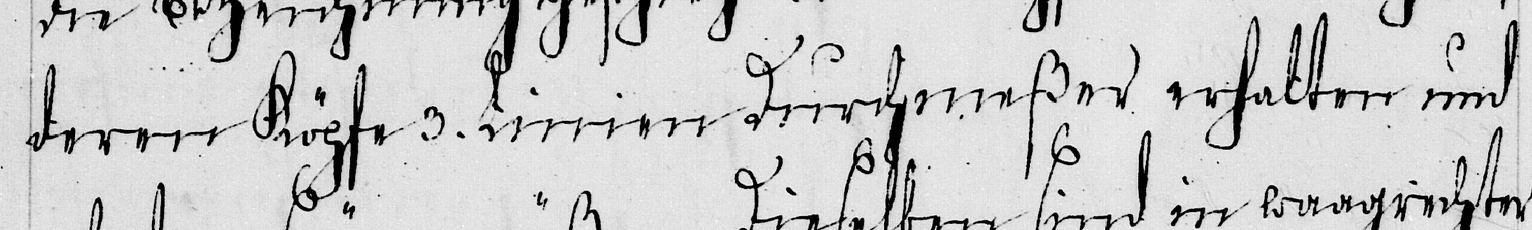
deren Köpfe 3. Linien Durchmeßer erhalten und
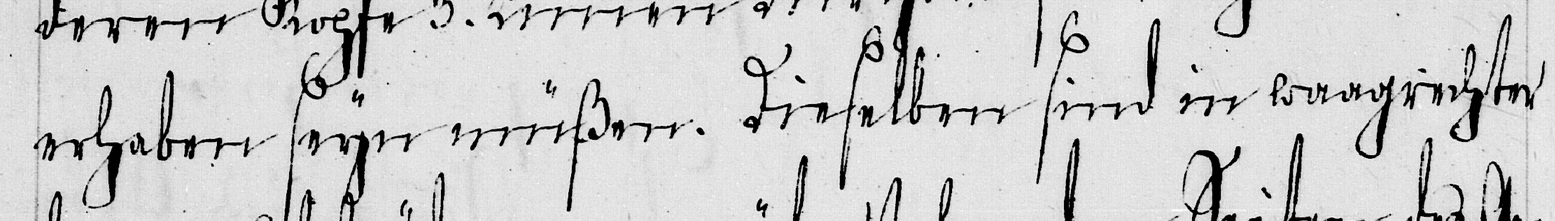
erhaben seyn müßen. Dieselben sind in waagrechter
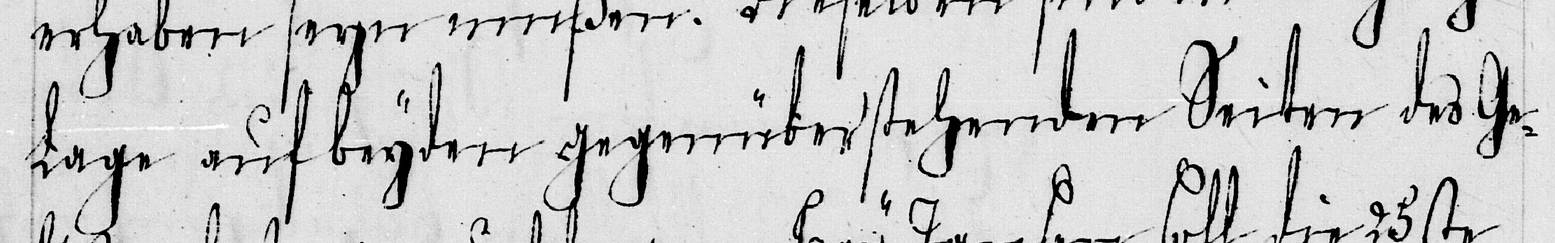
Lage auf beyden gegenüberstehenden Seiten des Ge¬
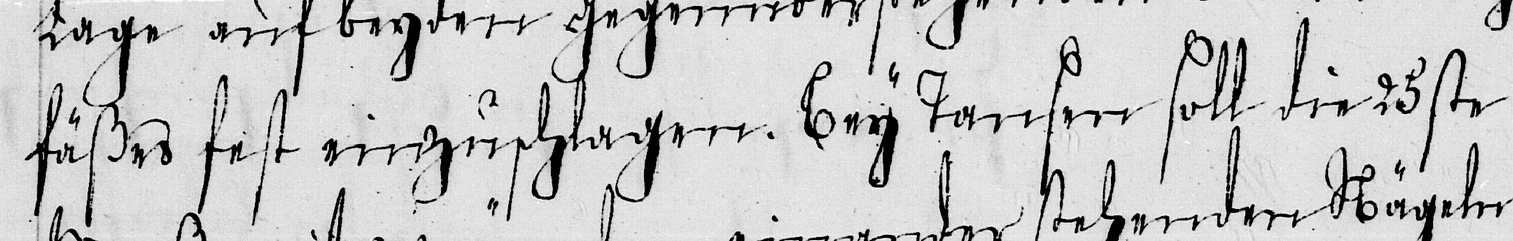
fäßes fest einzuschlagen. Bey Tansen soll die 25ste
